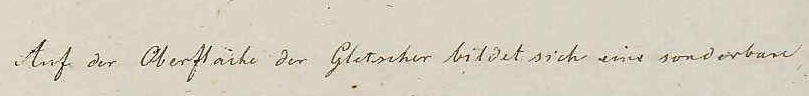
Auf der Oberfläche der Gletscher bildet sich eine sonderbare
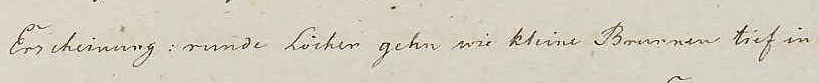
Erscheinung: runde Löcher gehn wie kleine Brunnen tief in
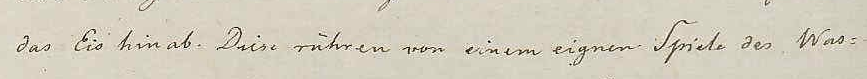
das Eis hinab. Diese rühren von einem eignen Spiele des Was-
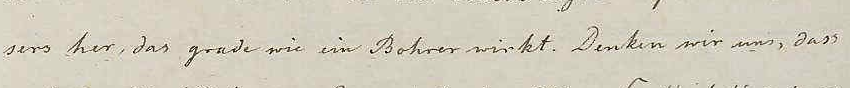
sers her, das grade wie im Bohrer wirkt. Denken wir uns, dass
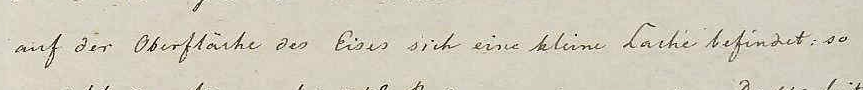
auf der Oberfläche des Eises sich eine kleine Lache befindet: so
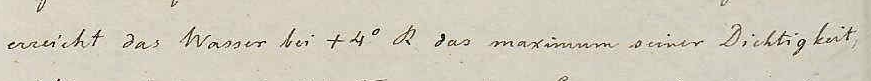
erreicht das Wasser bei +4° R das maximum seiner Dichtigkeit,
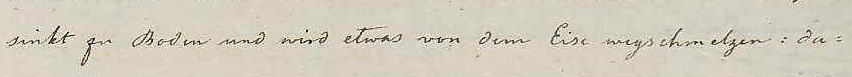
sinkt zu Boden und wird etwas von dem Eise wegschmelzen: da-
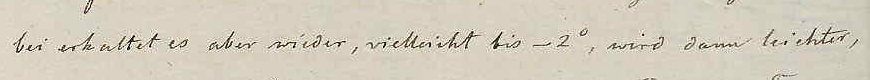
bei erkaltet es aber wieder, vielleicht bis −2°, wird dann leichter,
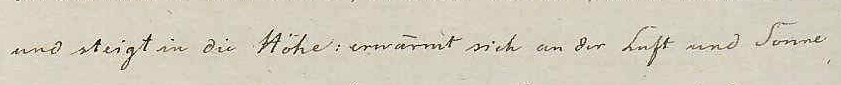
und steigt in die Höhe: erwärmt sich an der Luft und Sonne
